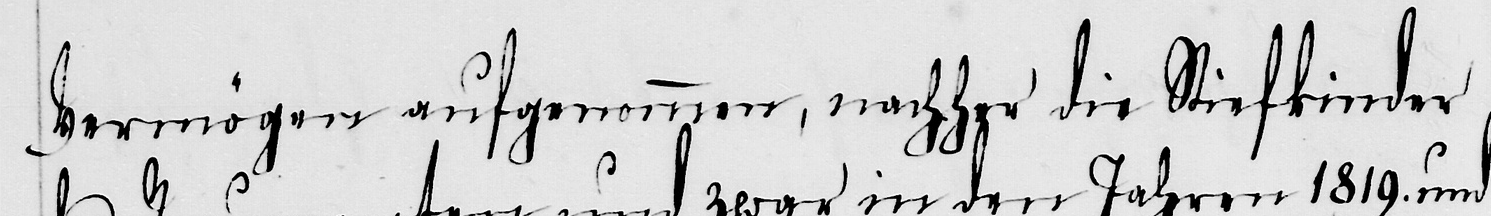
Vermögen aufgenommen, nachher die Stiefkinder
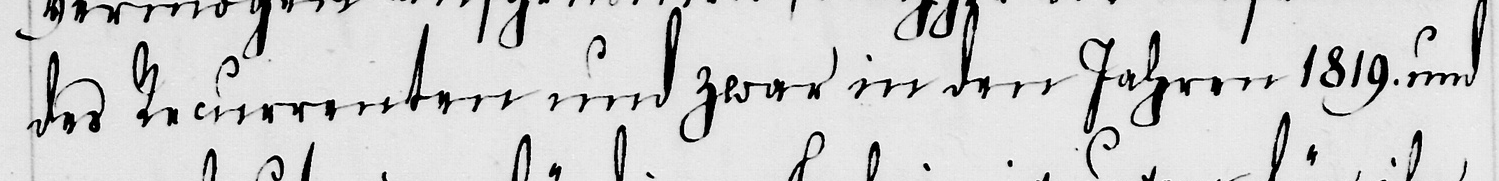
des Recurrenten und zwar in den Jahren 1819. und
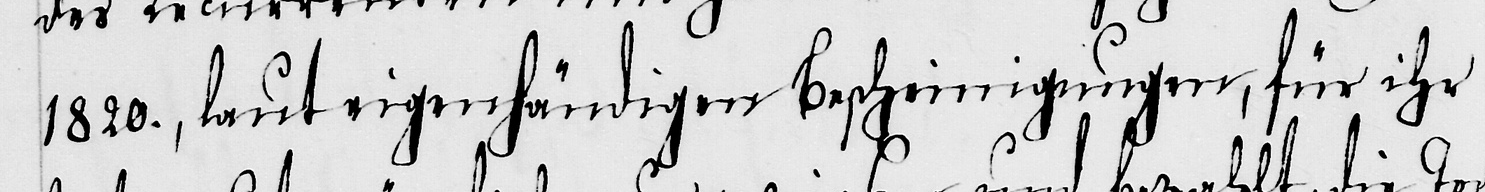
1820. laut eigenhändigen Bescheinigungen, für ihr
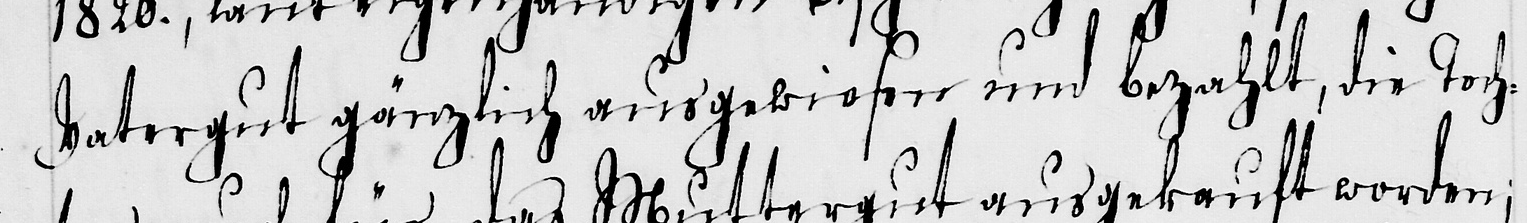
Vatergut gänzlich ausgewiesen und bezahlt, die Toc¬
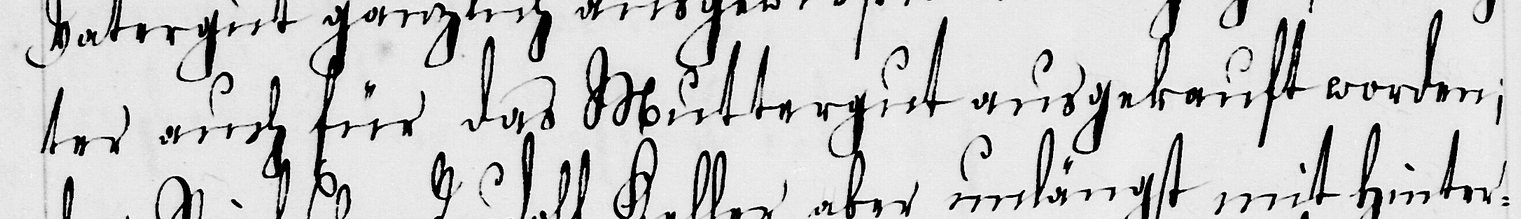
hter auch für das Muttergut ausgekauft worden;
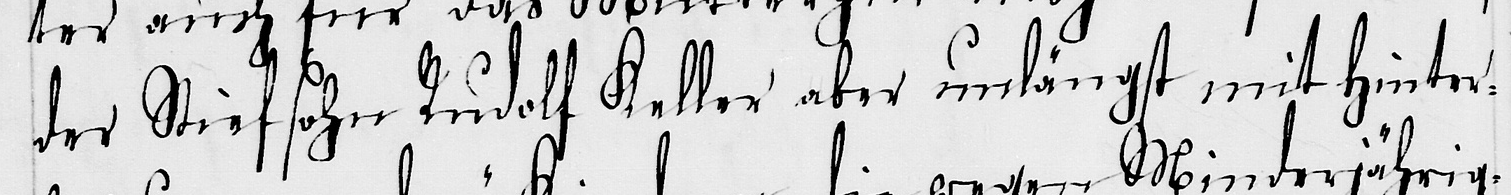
der Stiefsohn Rudolf Keller aber unlängst mit Hinter¬
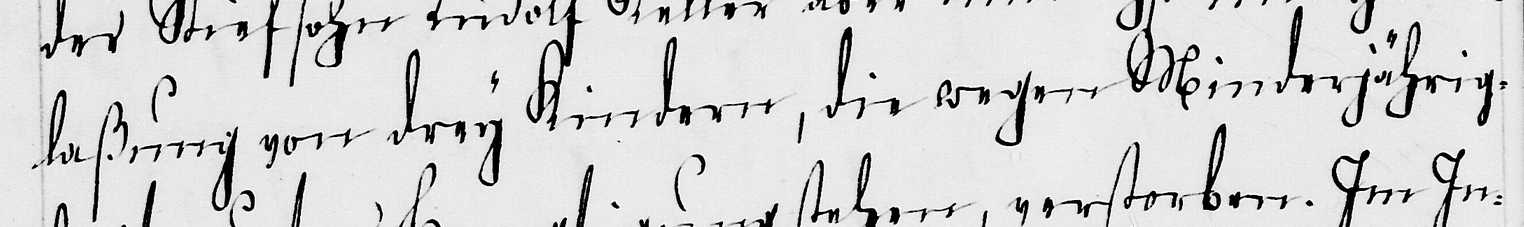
laßung von drey Kindern, die wegen Minderjährig¬
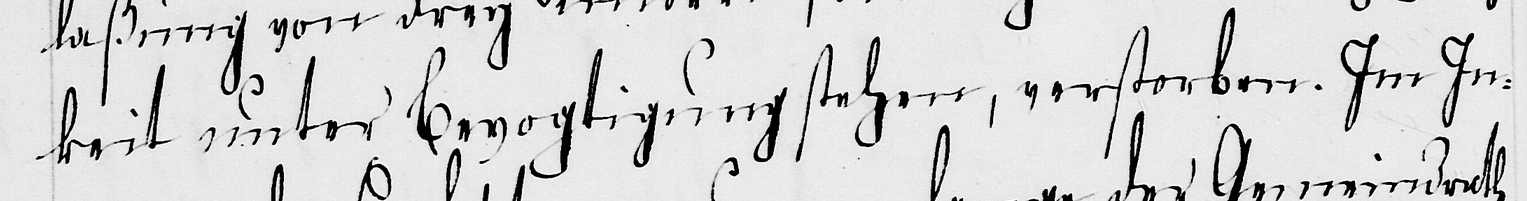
keit unter Bevogtigung stehen, verstorben. Im In¬
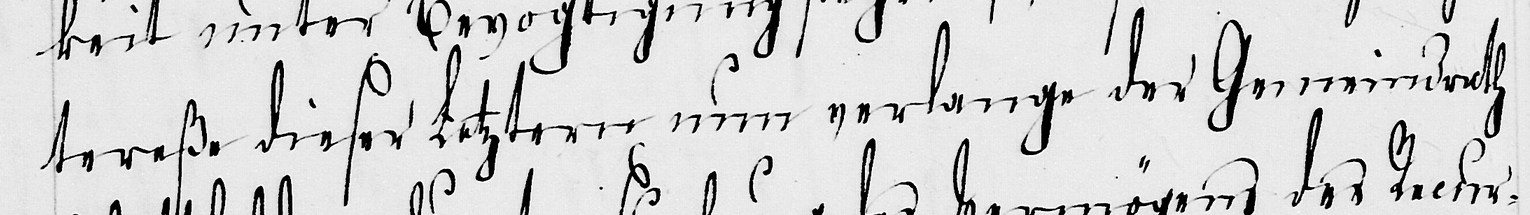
tereße dieser Letztern nun verlange der Gemeindrath
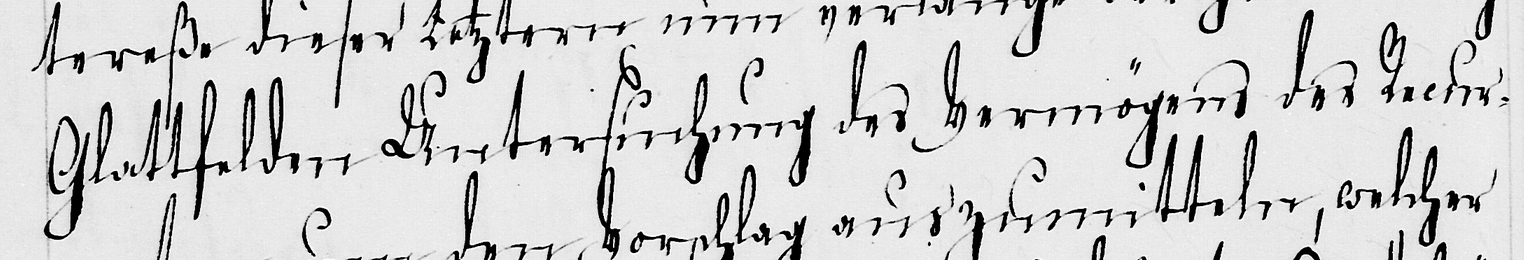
Glattfelden Untersuchung des Vermögens des Recur¬
